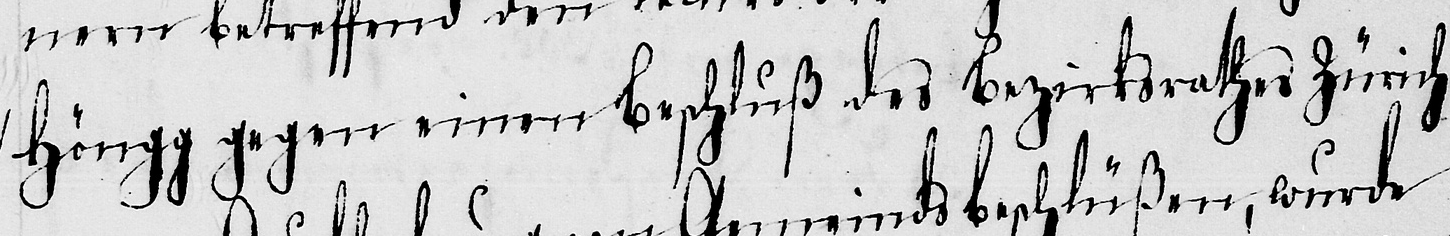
Höngg gegen einen Beschluß des Bezirksrathes Zürich
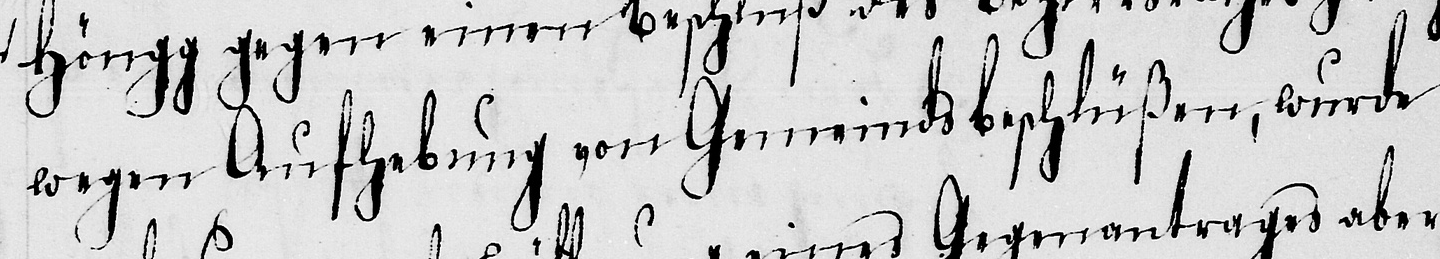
wegen Aufhebung von Gemeindsbeschlüßen, wurde
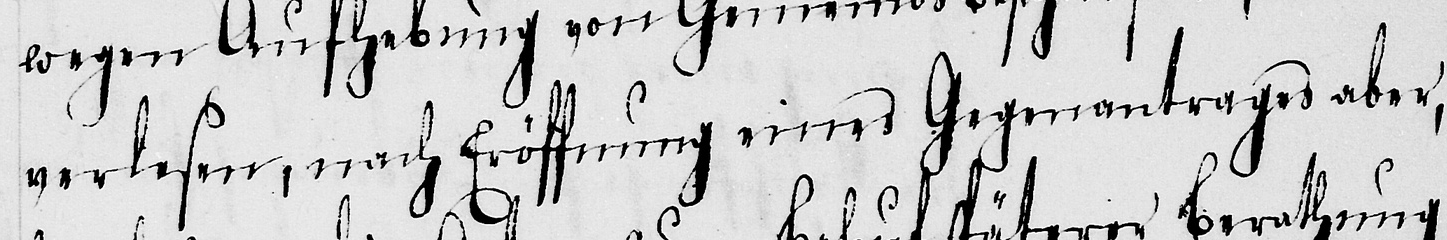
verlesen, nach Eröffnung eines Gegenantrages aber,
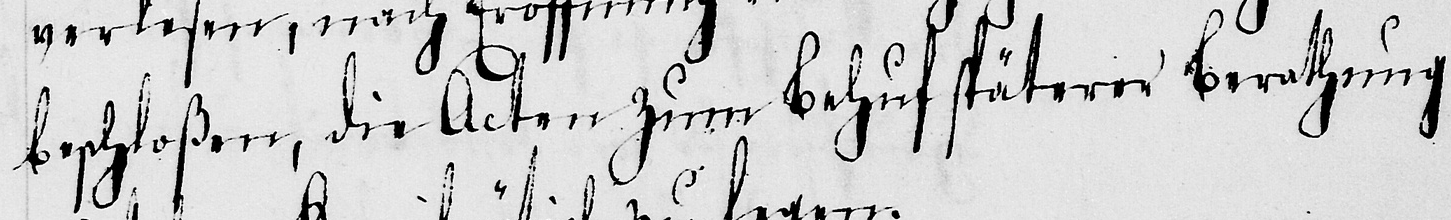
beschloßen, die Acten zum Behuf späterer Berathung
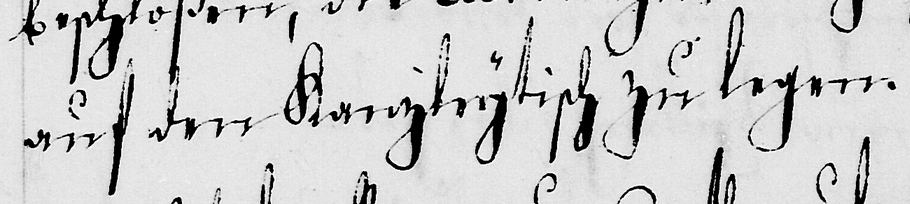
auf den Kanzleytisch zu legen.
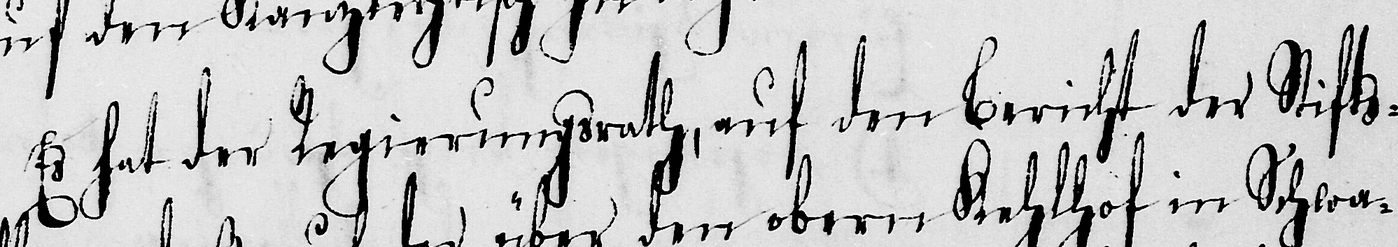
Es hat der Regierungsrath, auf den Bericht der Stifts¬
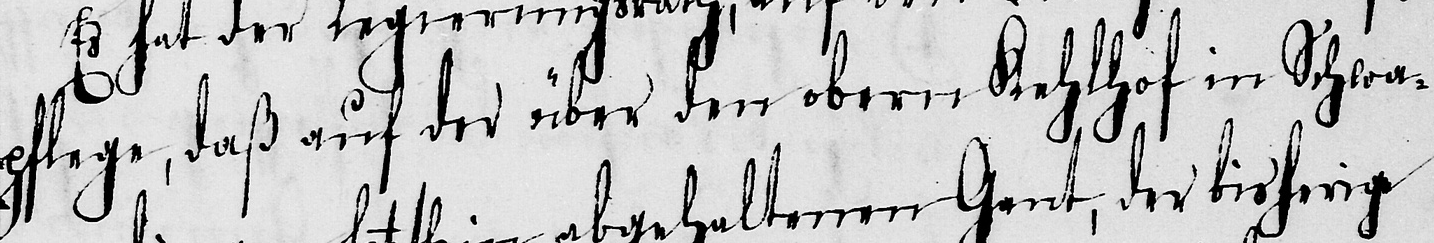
pflege, daß auf der über den obern Kehlhof in Schwam¬
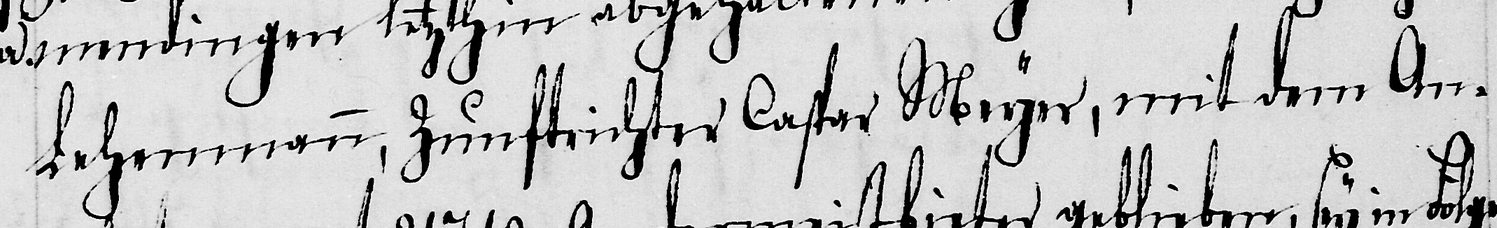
Lehenmann, Zunftrichter Caspar Meyer, mit dem An¬
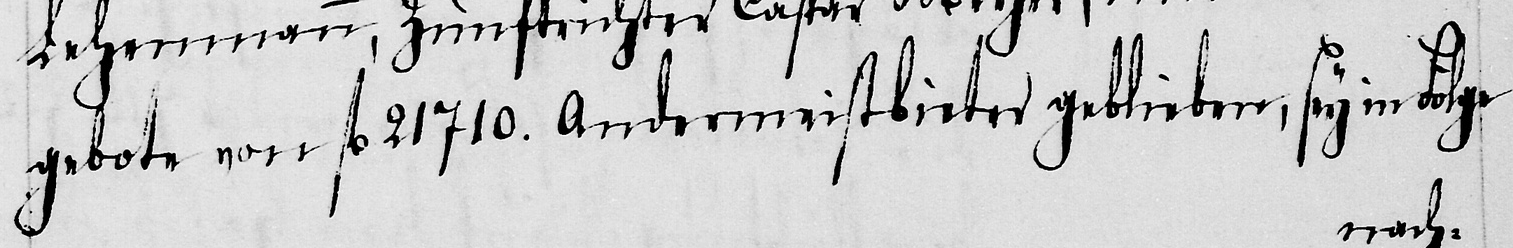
gebote vom fl. 21710. Andermeistbieter geblieben, sey in Folge
